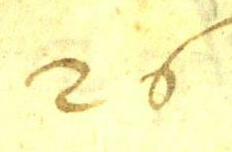26
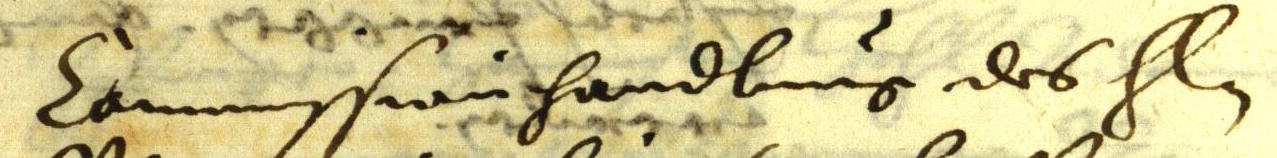Commission handlūng des hln
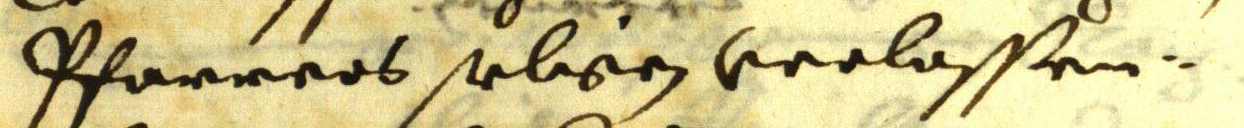Pfarrers seligen verlassen¬
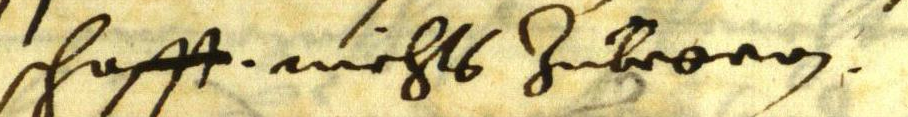schafft. nichts Zūbegern.
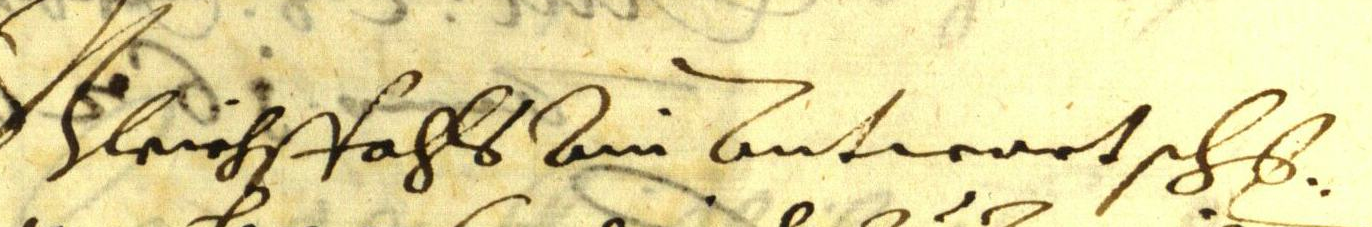Gleichsfahls Ain Antwortsch:
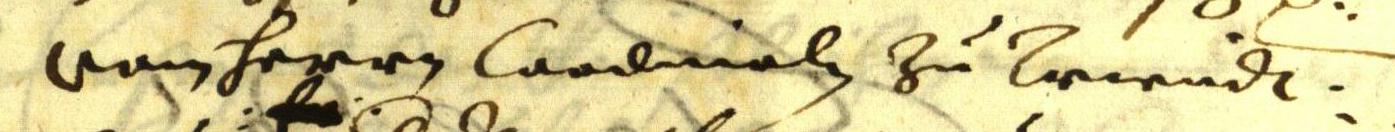vom herrn Cardinaln Zū Triendt.
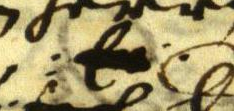:Er:
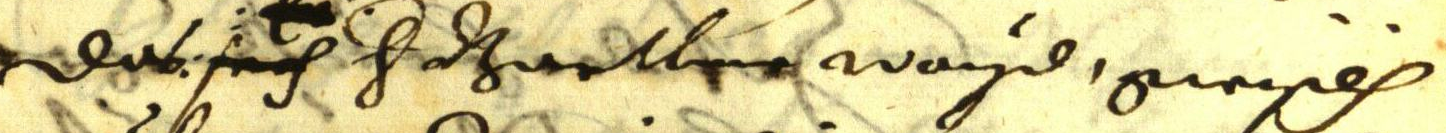Das: xxx h Bartlme Waȳd, gwislh
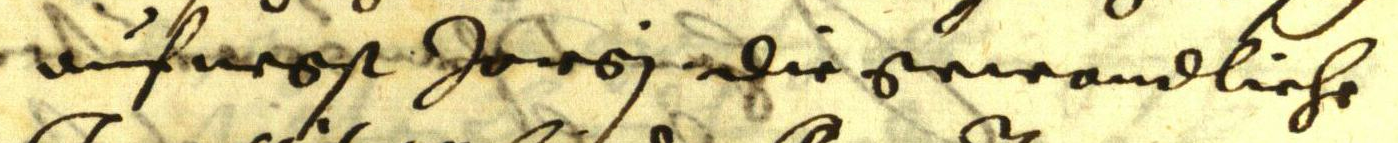aūf negst Jorgj die gewondliche
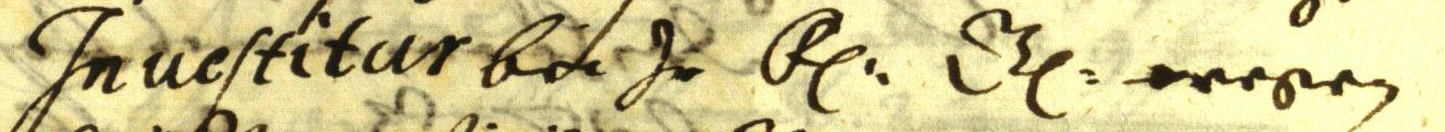Investitur bei Ir F: G: wegen
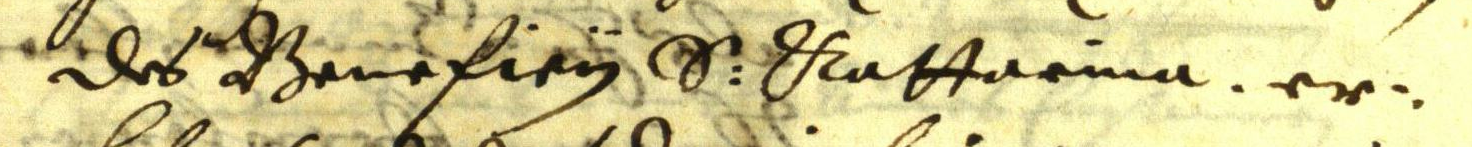Des Beneficÿ S: Kattarina. er¬
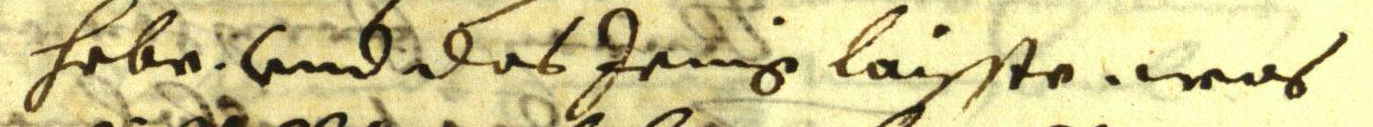hebe. vnd das Ienig laisste. was
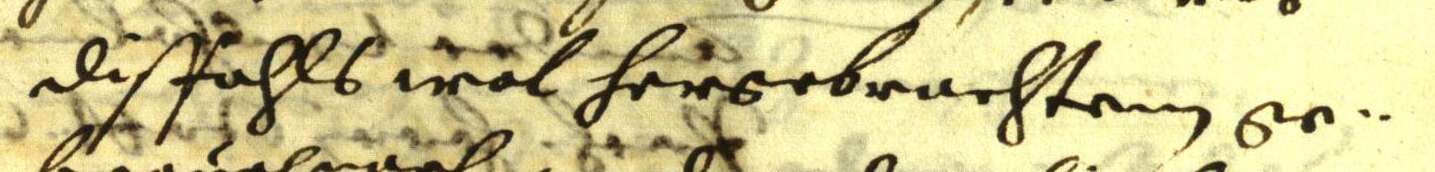disfahls wol hergebrachtem ge¬
